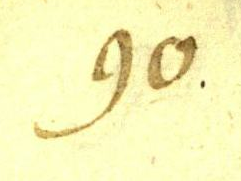90
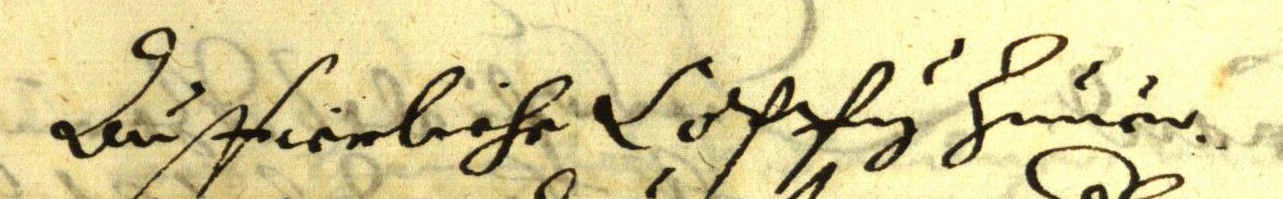Aūsfierliche CoPPȳ Zūūer¬
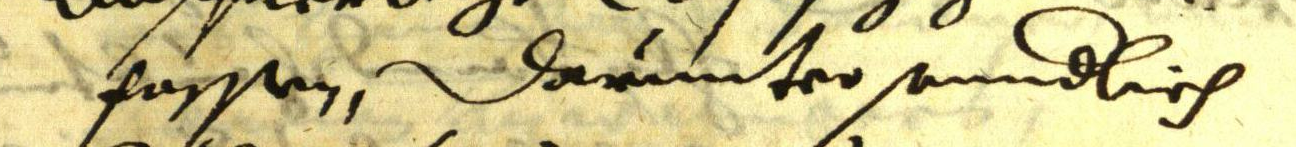fassen, Darūnter sonndlich
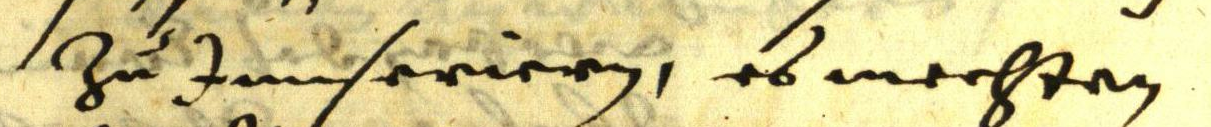Zū Innseriern, es mechten
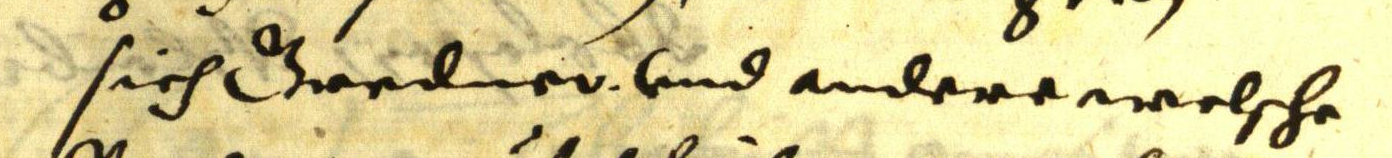sich Gredner. vnd anndere welsche
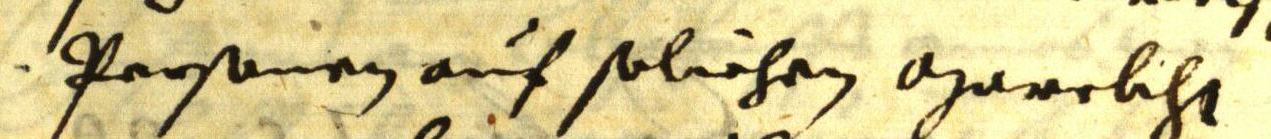Personen aūf solichen Marckht
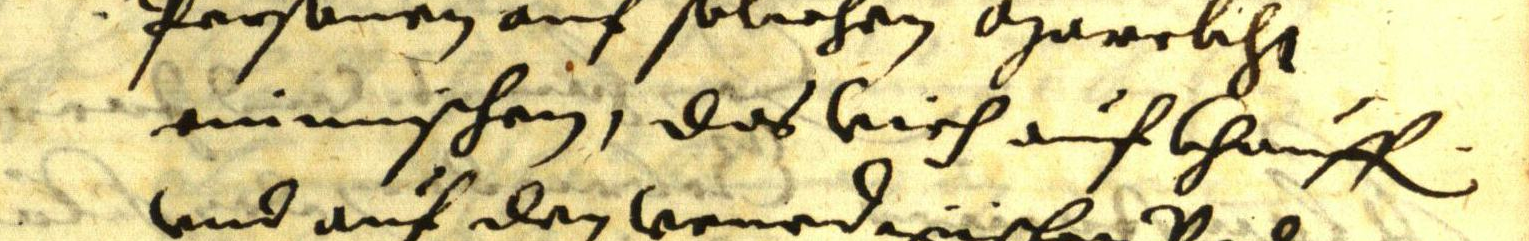einmischen, das vieh aūfkhaūff
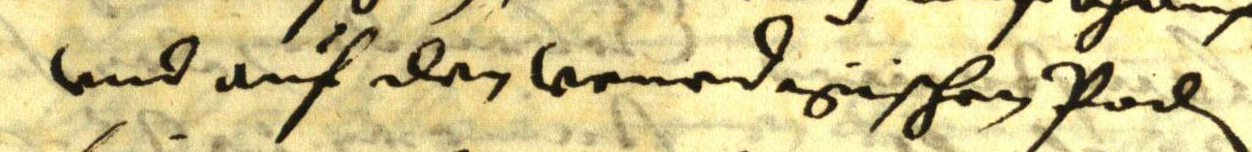vnd aūf den venedigischen Pod
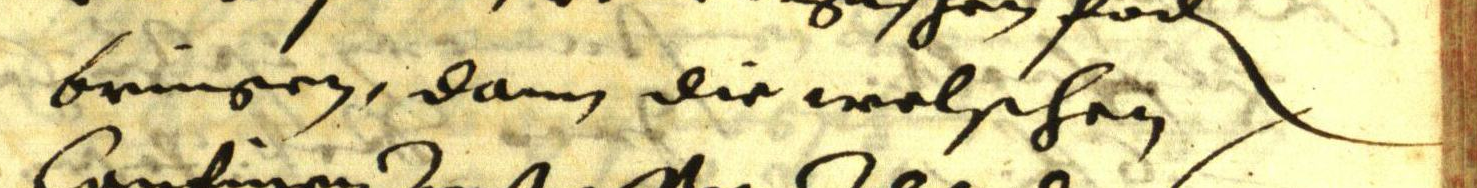bringen, dann die welschen
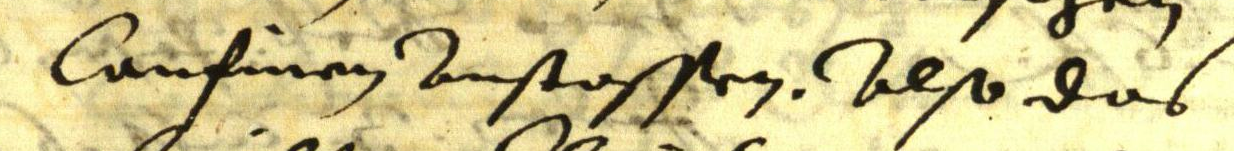Confinen Anstossen. Also das
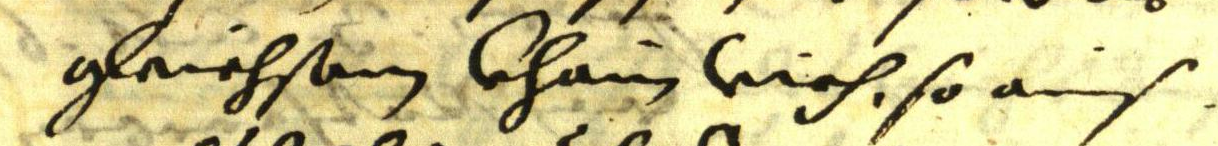gleichen khain vieh, so ains¬
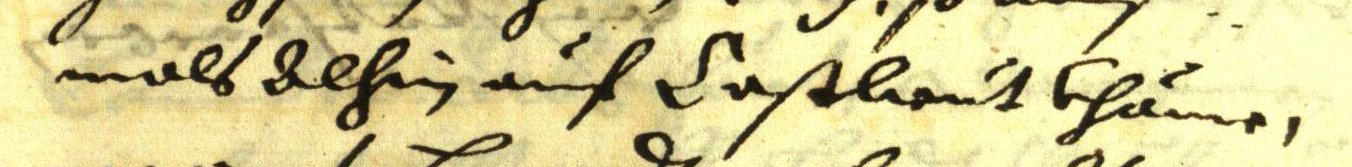mals Alhin aūf Castlrūt khāme,
